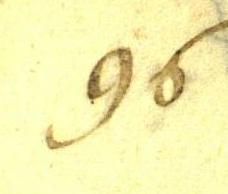96
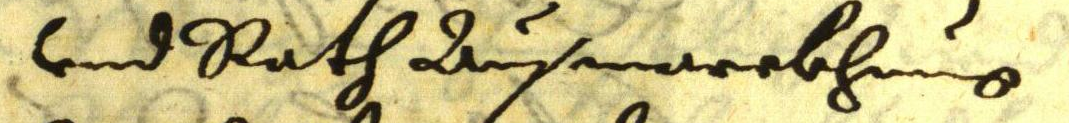vnd Rath Aūsmarckhūng
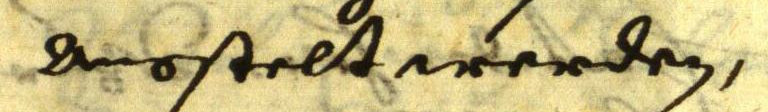Angstelt werden,
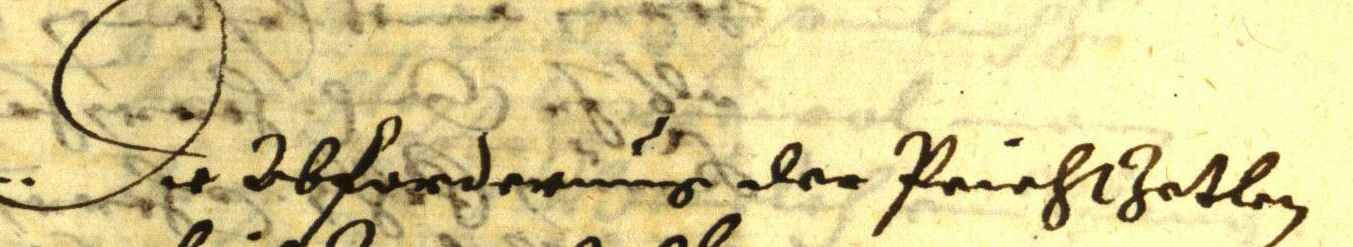Die Abforderūng der Peicht Zetlen
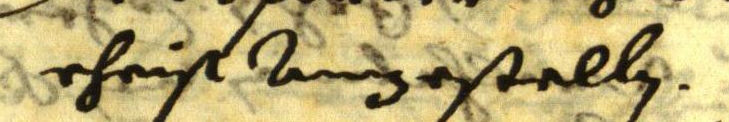ehist Anzestelln.
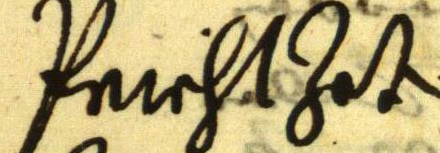Peicht Zet¬
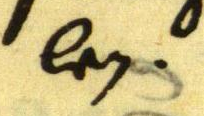len.
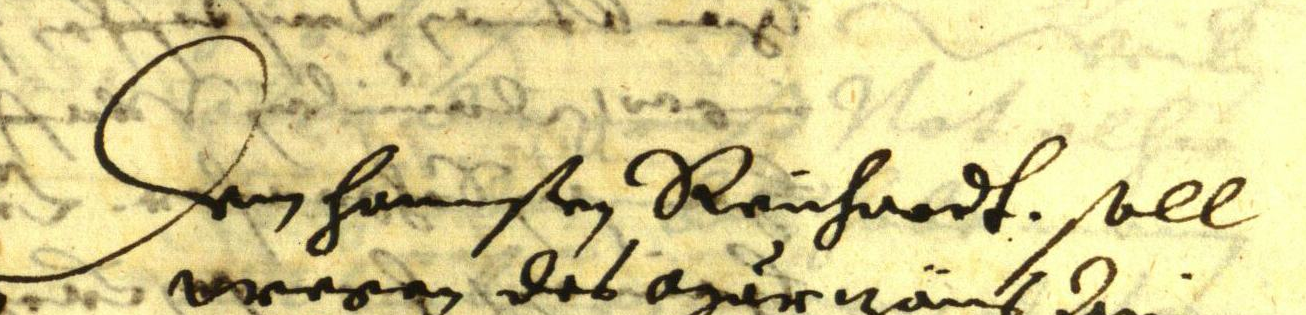Dem hannsen Reichardt. soll
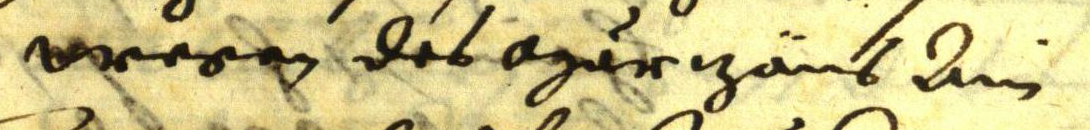wegen des Mārzäns Ain
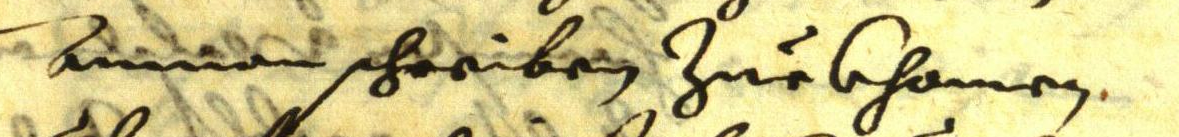Anmanschreiben Zūe khomen
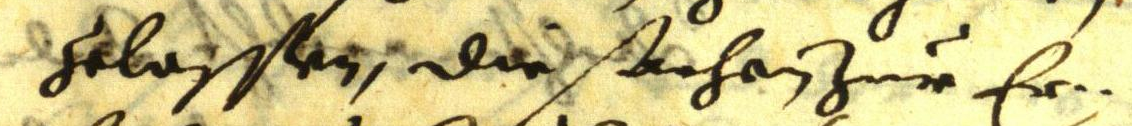Zelassen, die Sachen Zūr Er¬
